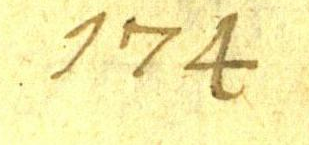174
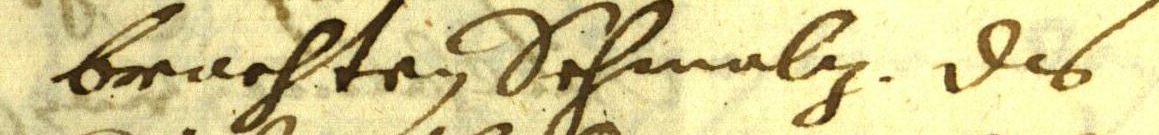brachten Schmalz. dis
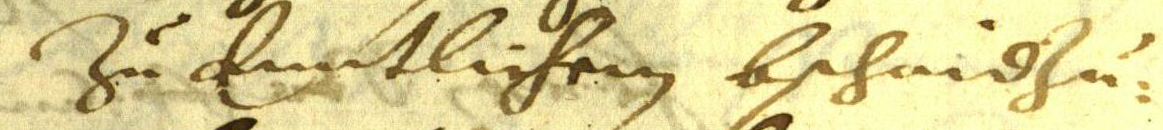Zū Enntlichen bschaid Zū¬
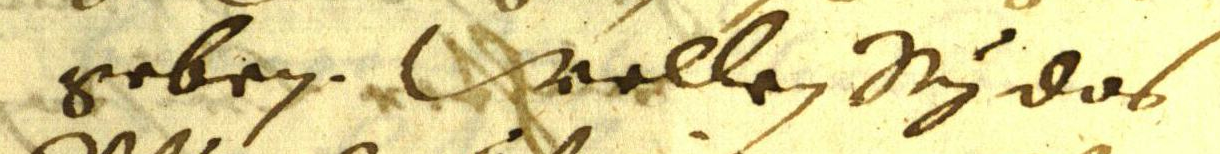geben. Wellen Sȳ das
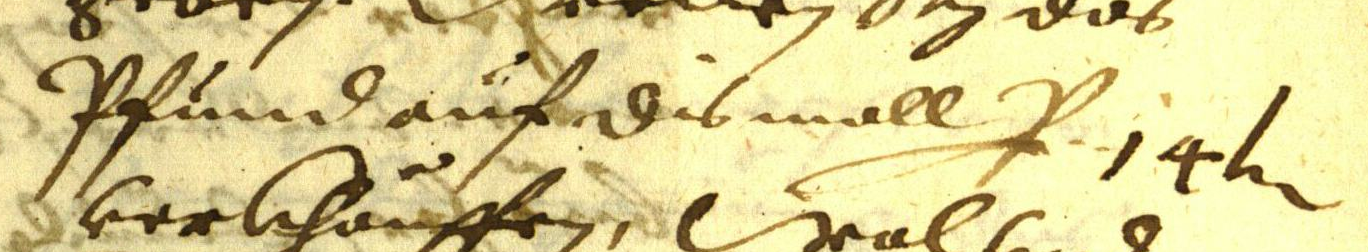Pfūnd aūf dis mall P: 14 k
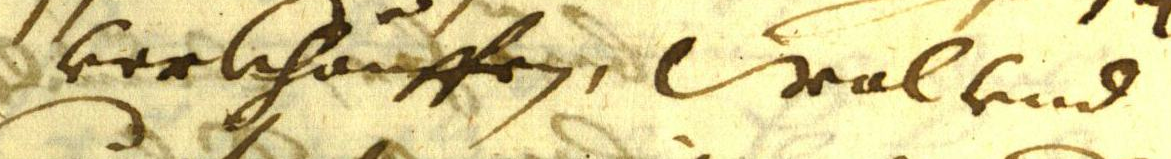verkhaūffen, Wol vnd
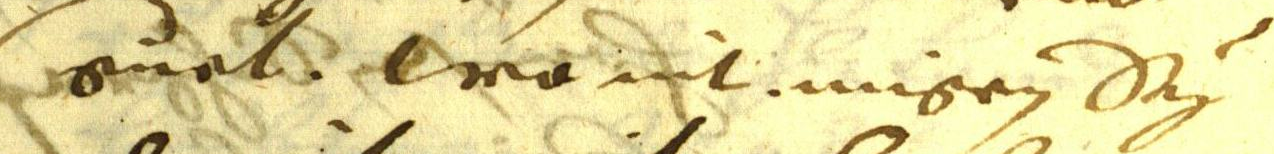gūet. wo nit. migen Sȳ
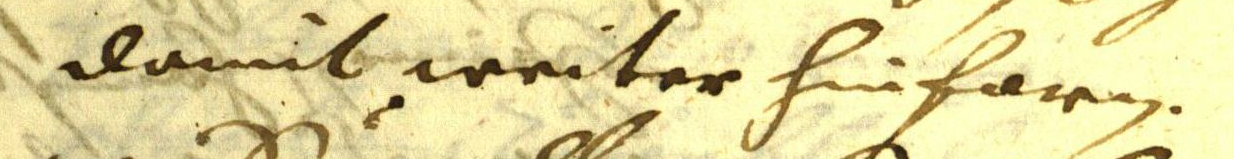damit weiter hinfarn.
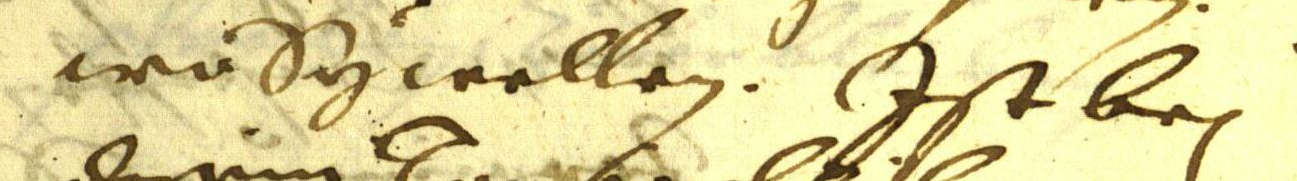wo Sȳ welln. Ist bej
